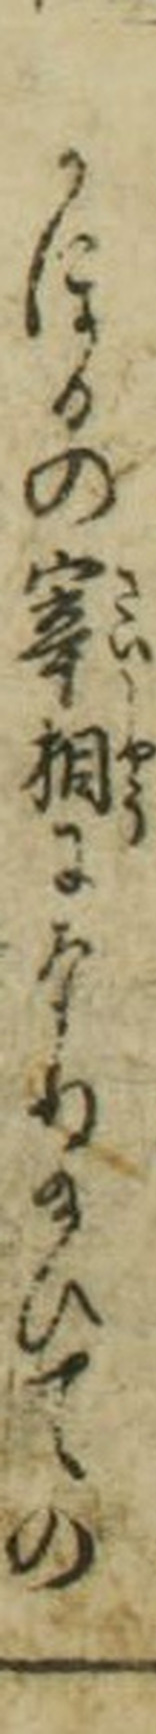かほるの宰相になり給ひての
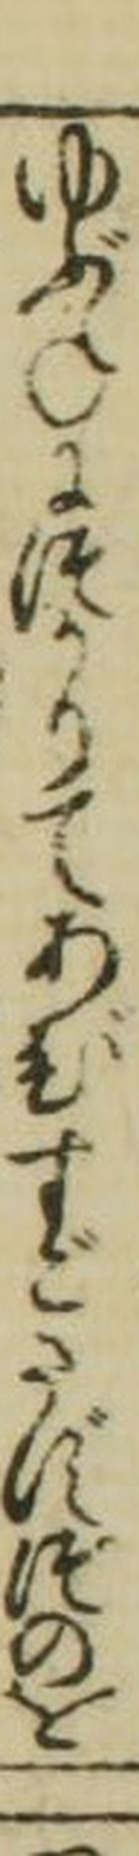ゆぶねにつかりてあびすごさず。つのを
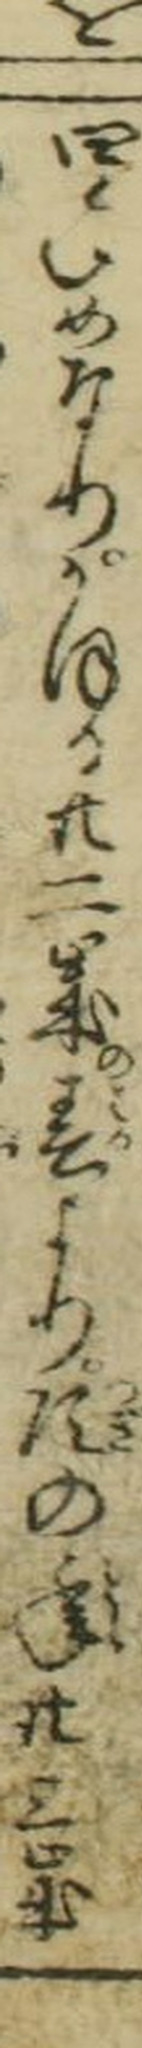四年めなり。かほる廿二歳春より。次の年廿三歳
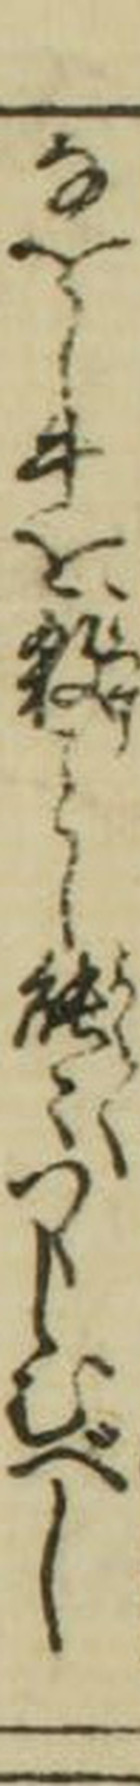なをし牛を殺ことし能々つゝしむべし
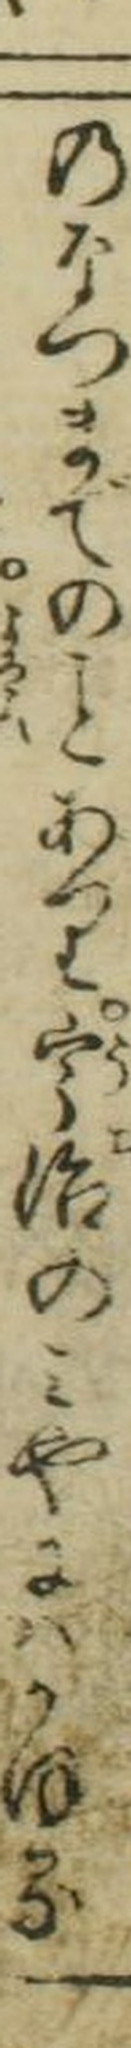のなつまでのことあり。宇治のみやにはかほる
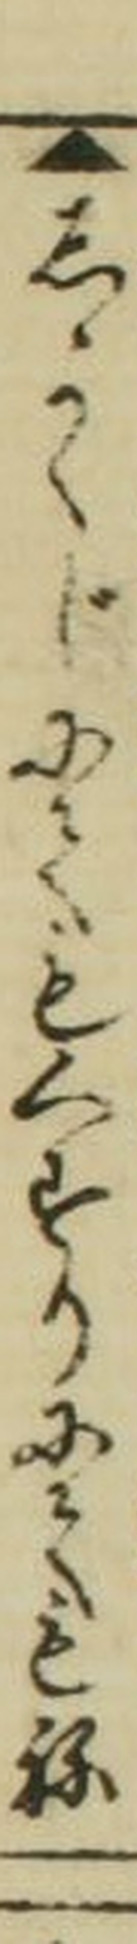▲しよくじにてもくすりにてもね
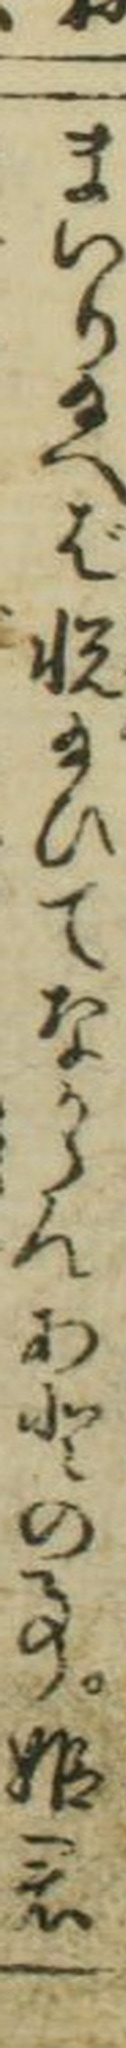まいり給へば。悦給ひてなからんあとの事。姫君
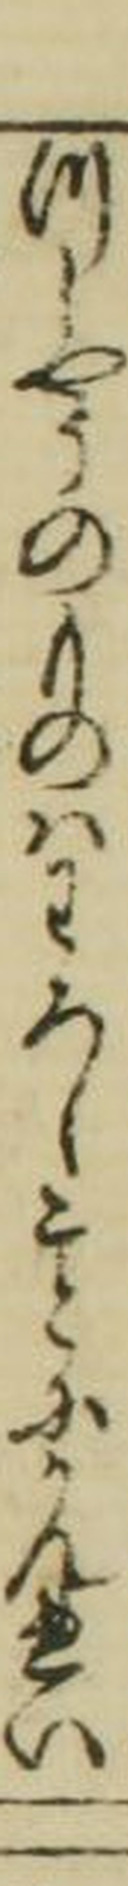つしやうのものはわろしことにかんれい
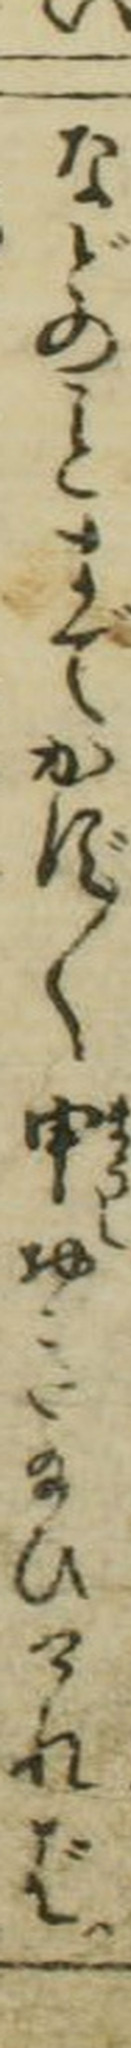などのことまでかず〳〵申おき給ひければ。
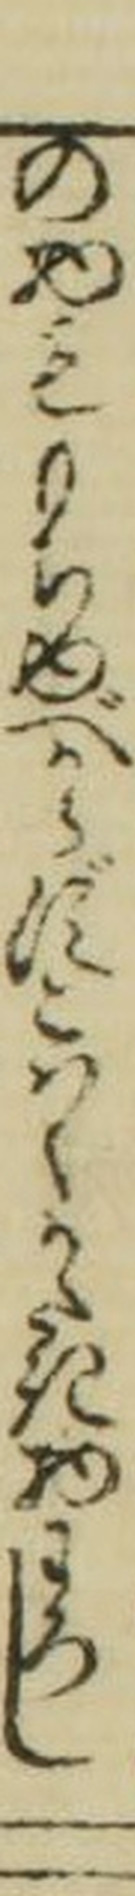の物ももちゆべからずこはくかたき物わろし
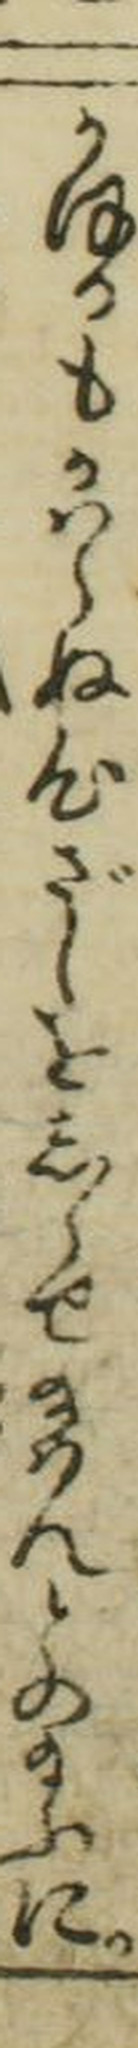かほるもかはらぬ心ざしをしらせ給はんとの給ふに。
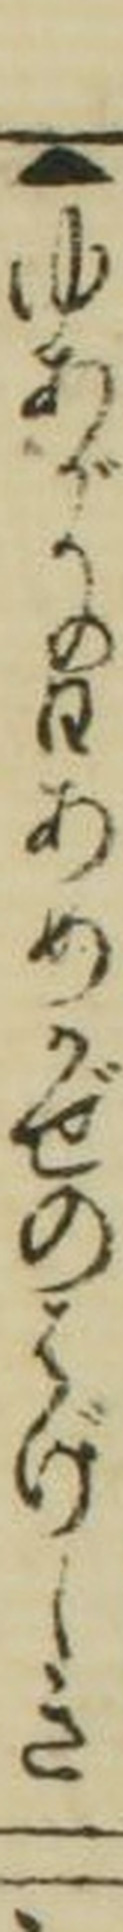▲ゆあがりの日あめかぜのはげしき
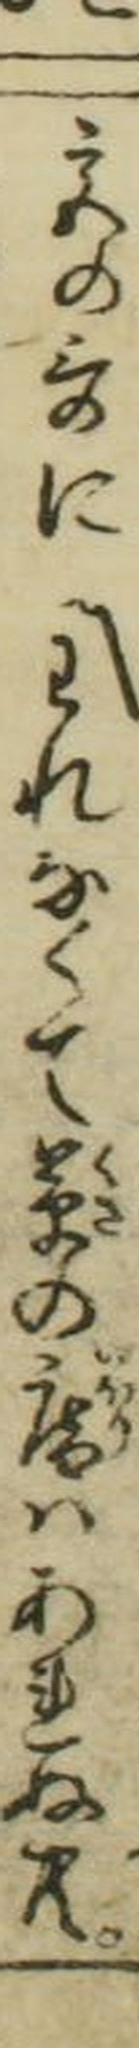宮の哥に〽われなくて草の庵はあれぬ共。
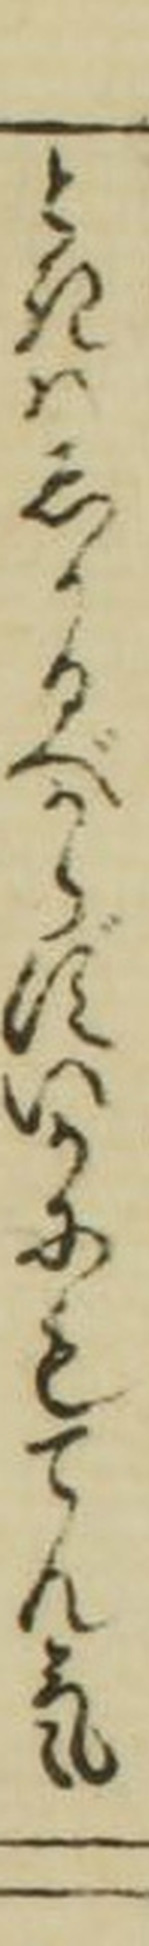ときはしかるべからずいかにもてん気
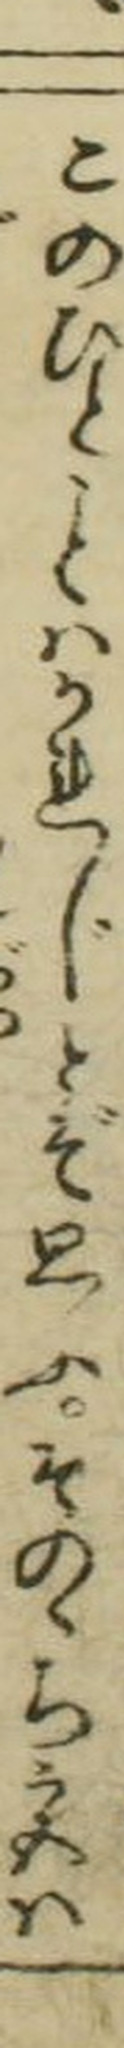このひとことはかれじとぞ思ふ。そのゝち宮は
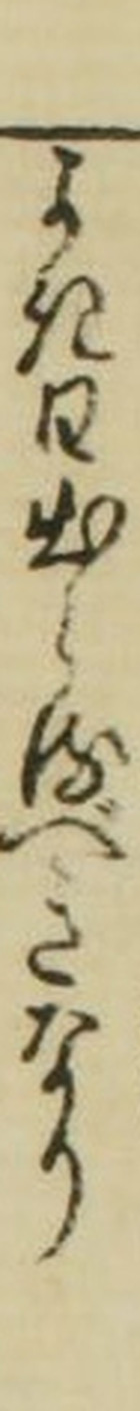よき日出らるべきなり
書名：女源氏教訓鑑
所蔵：東京学芸大学附属図書館
